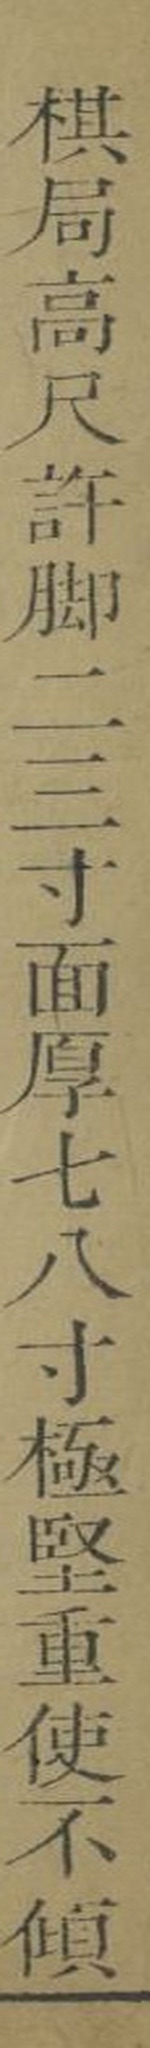棋局高尺許脚二三寸面厚七八寸極堅重使不傾
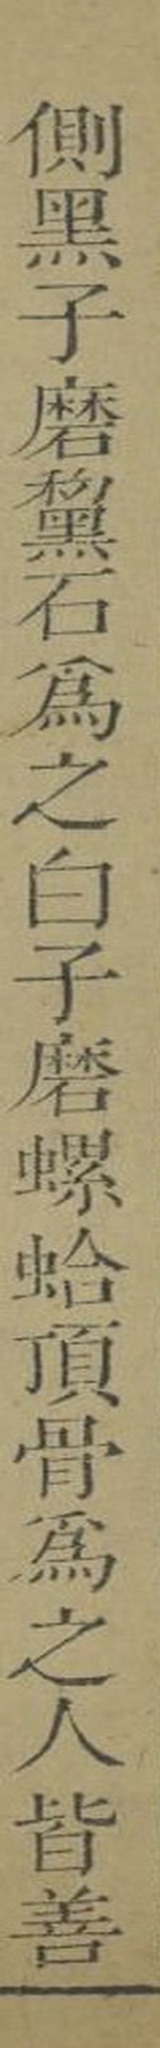側黒子磨黧石為之白子磨螺蛤頂骨為之人皆善
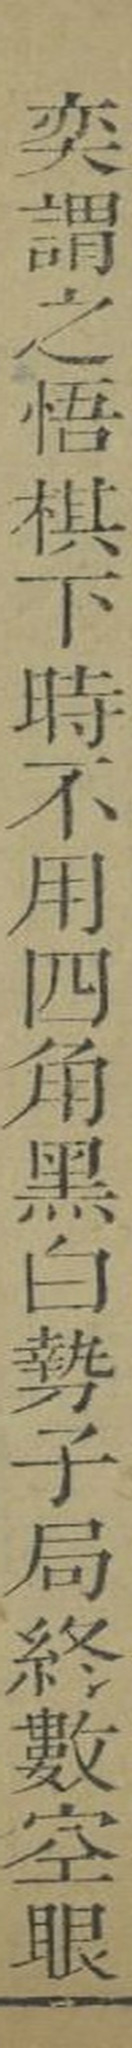奕謂之悟棋下時不用四角黒白勢子局終数空眼
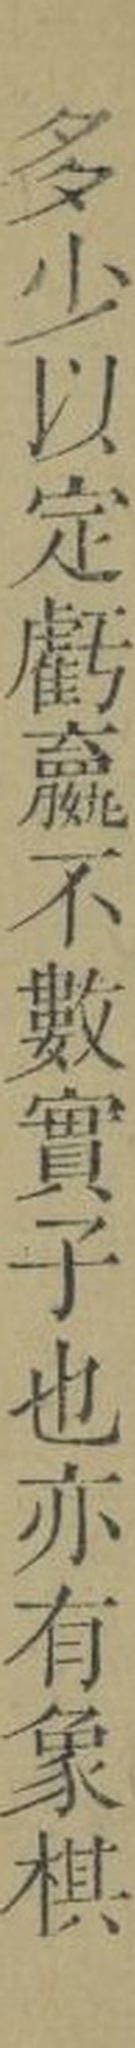多少以定虧嬴不数実子也亦有象棋
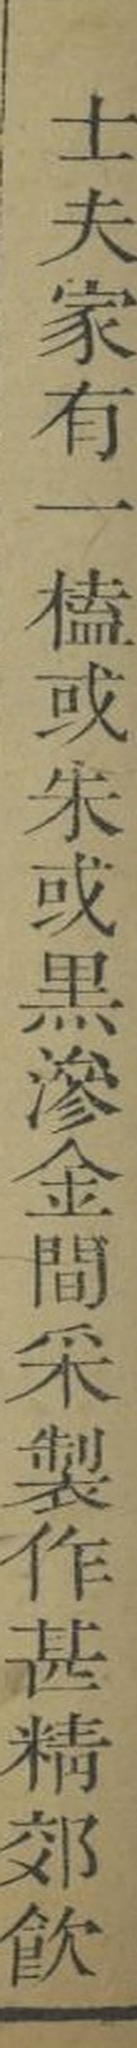士夫家有一榼或朱或黒滲金間采製作甚精郊飲
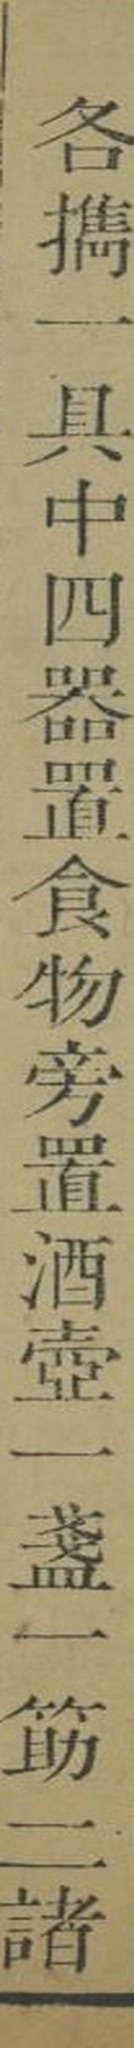各携一具中四器置食物旁置酒壺一盞一筯二諸
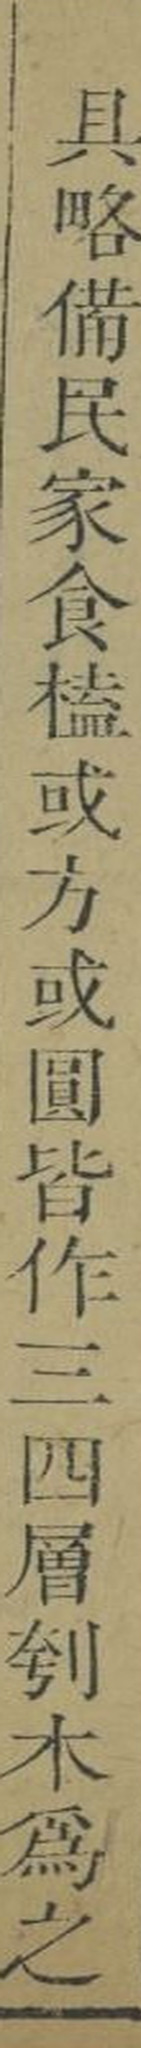具略備民家食榼或方或円皆作三四層刳木為之

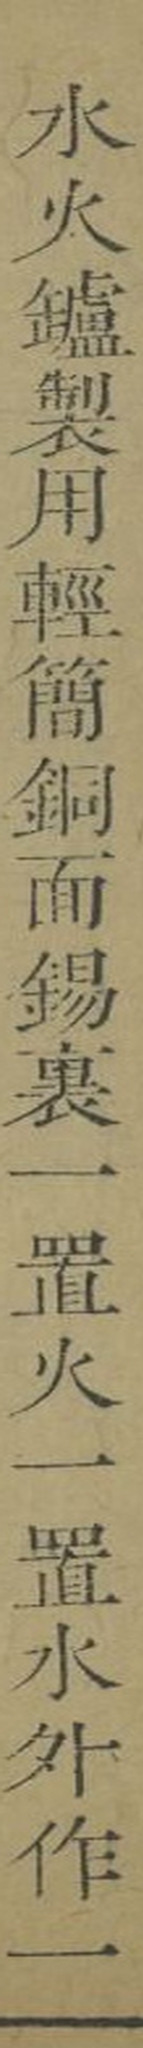水火罏製用軽簡銅面錫裏一置火一置水外作一
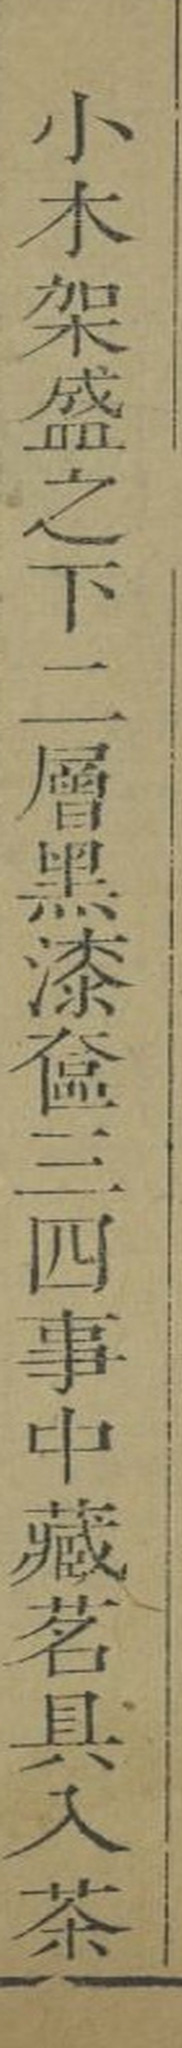小木架盛之下二層黒漆奩三四事中蔵茗具入茶
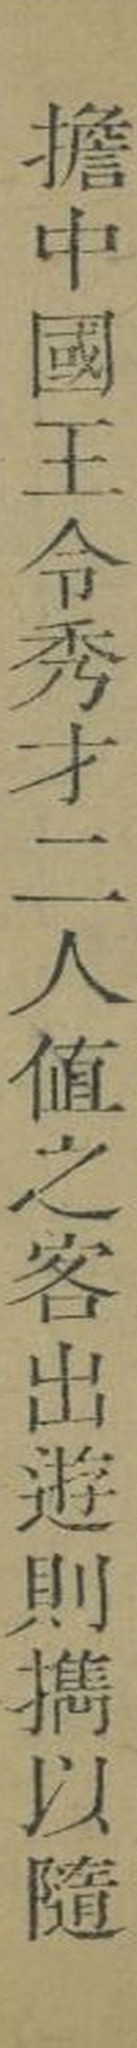担中国王令秀才二人値之客出遊則携以随
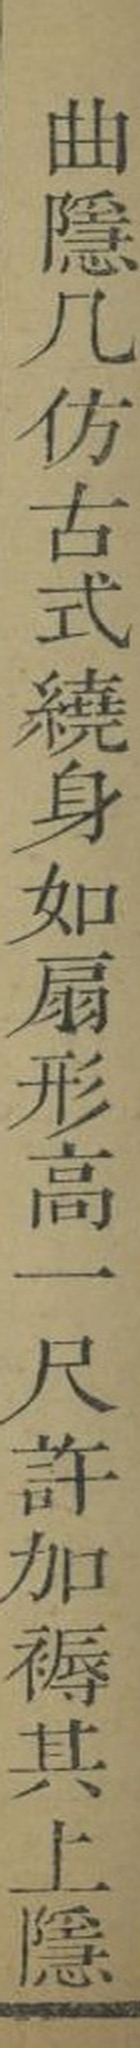曲隠几仿古式繞身如扇形高一尺許加褥其上隠
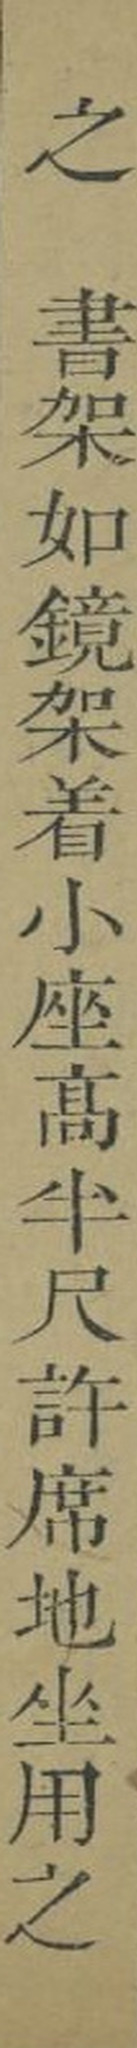之書架如鏡架着小座高半尺許席地坐用之

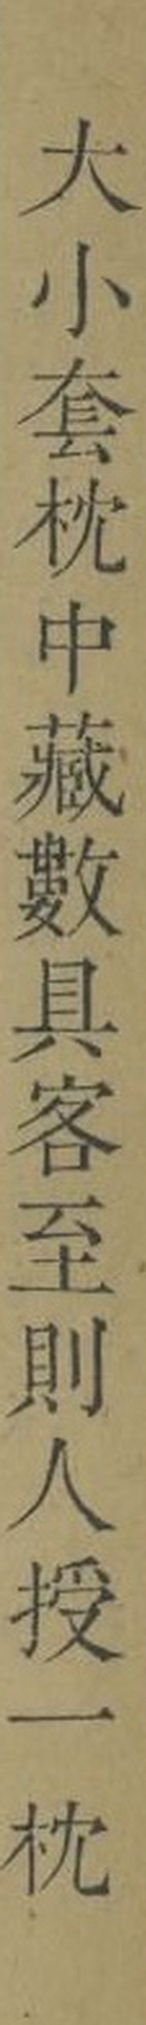大小套枕中蔵数具客至則人授一枕
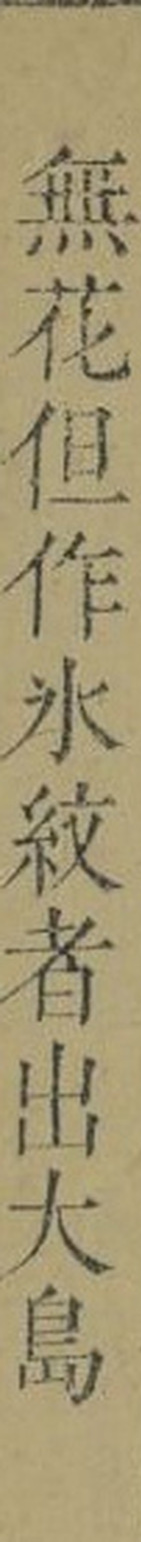無花但作氷紋者出大島
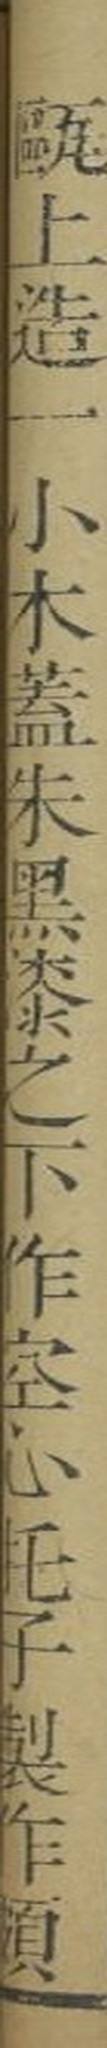甌上造一小木蓋朱黒漆之下作空心托子製作頗
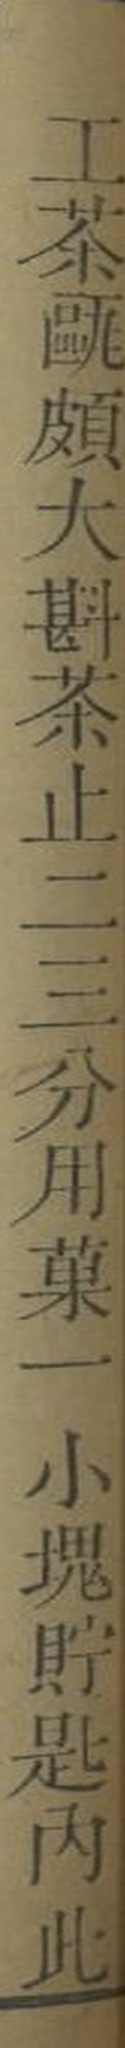工茶甌頗大斟茶止二三分用菓一小塊貯匙内此
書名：中山伝信録 巻六
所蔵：University of the Ryukyus Library
